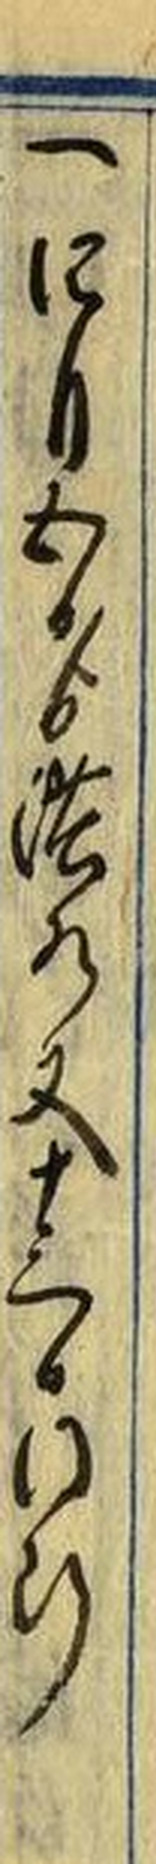一四月五日ゟ洪水又十三日同断
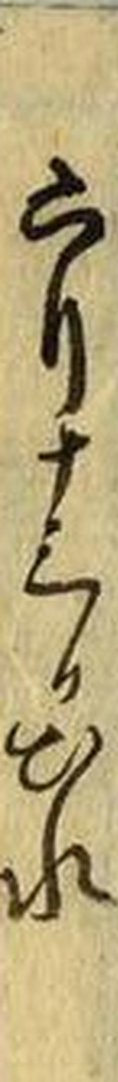六月十三日出水
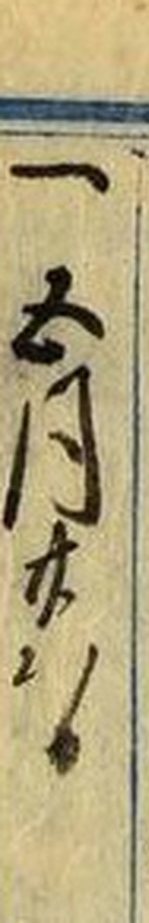一五月廿八日
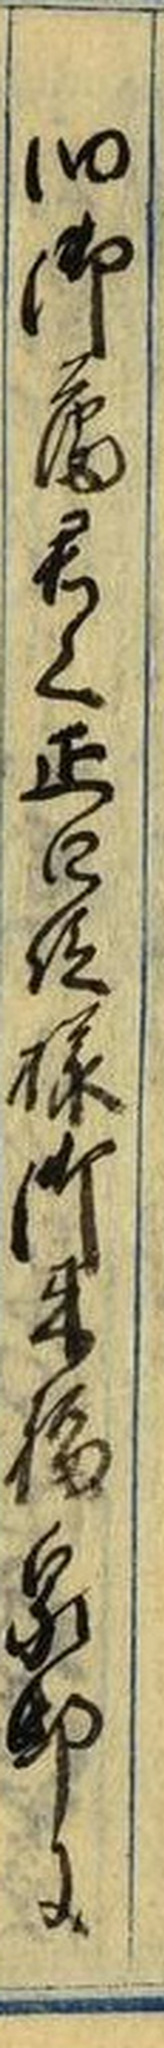旧御藩君上正四位様御来福泉邸に
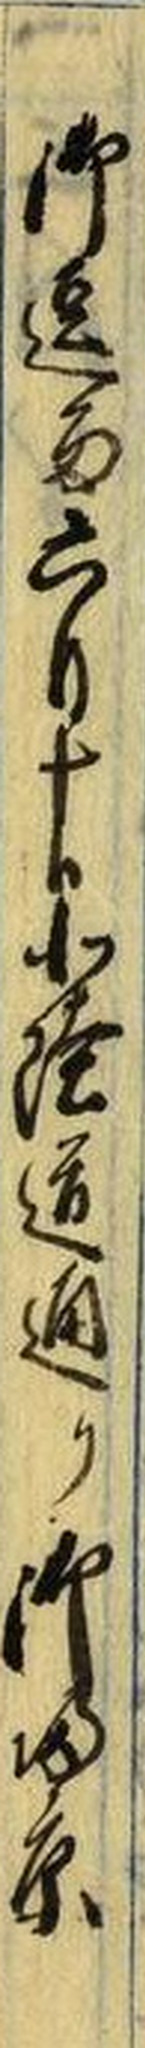御逗留六月十日北陸道通り御帰京
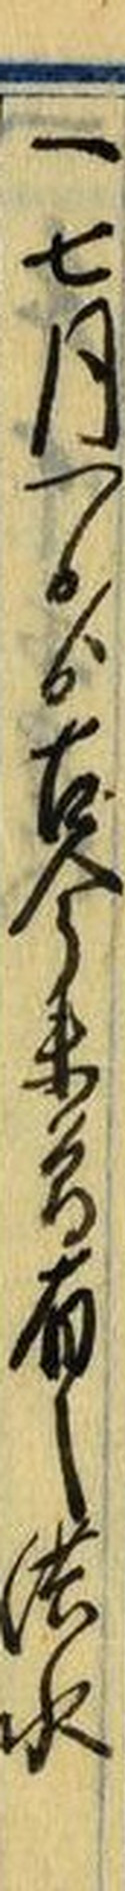一七月一日ゟ古今未曾有之洪水
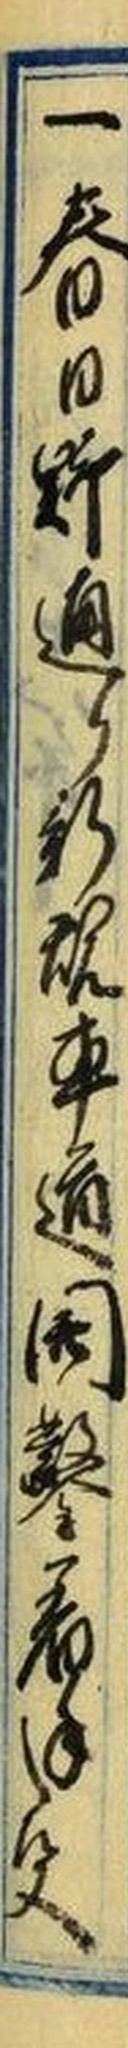一春日野通り新規車道開鑿着手之事
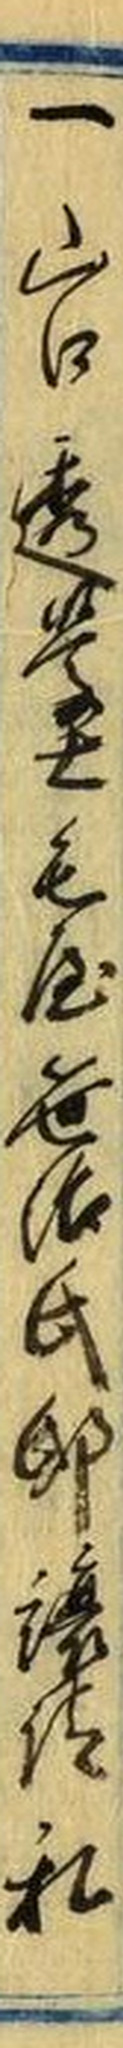一山口透学士毛屋笹治氏邸譲請私
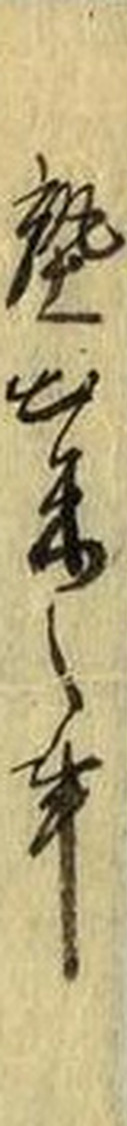塾出来之事
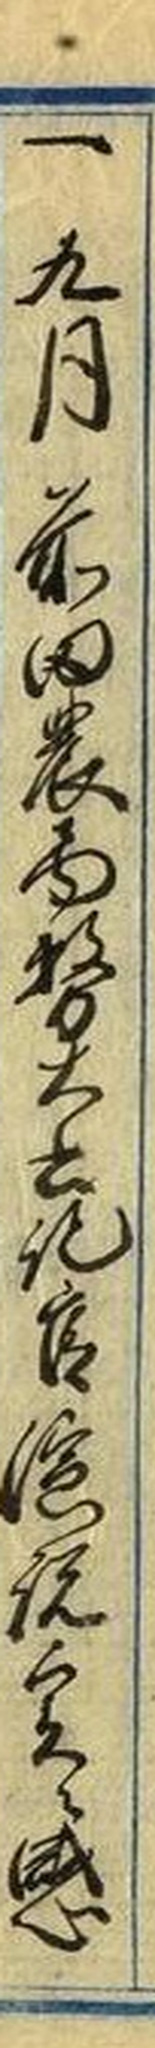一九月前田農商務大書記官演説実に感
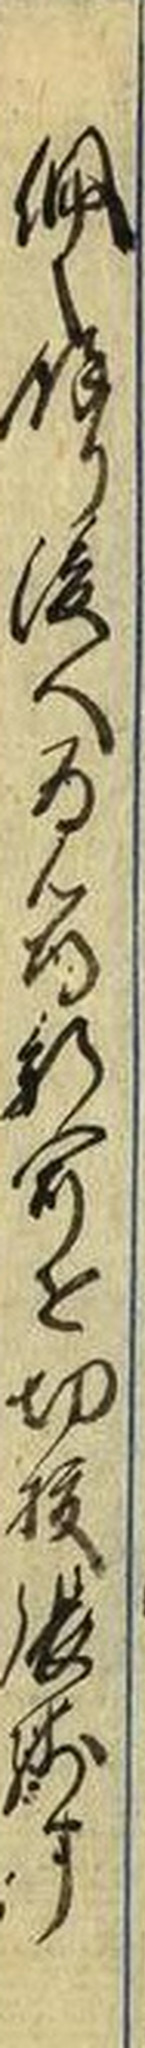佩之余り御人為心得新聞を切抜張残す
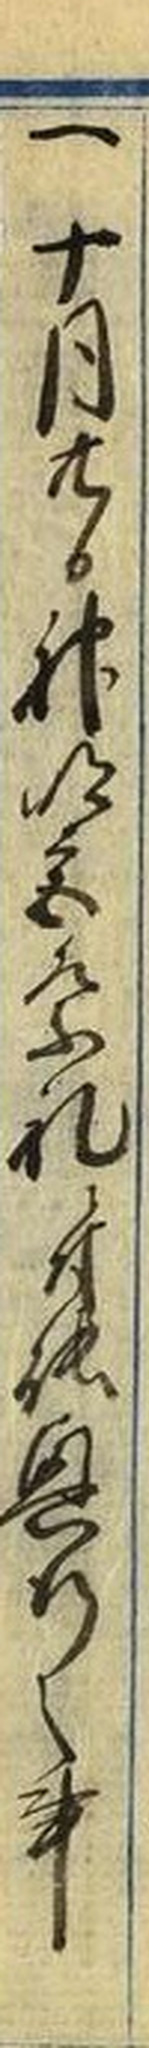一十月廿日神明宮御祭礼に付能興行之事
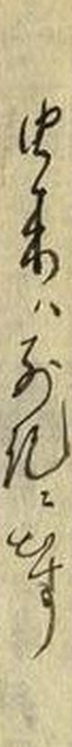由来は別記に出す
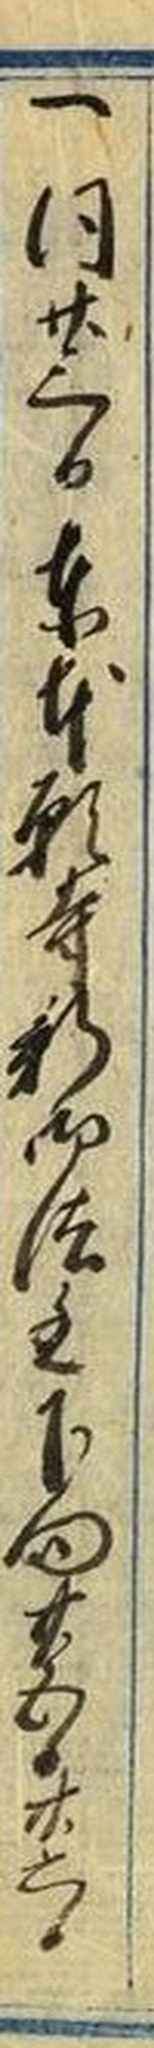一同廿三日東本願寺新御法主下向廿五日廿六日
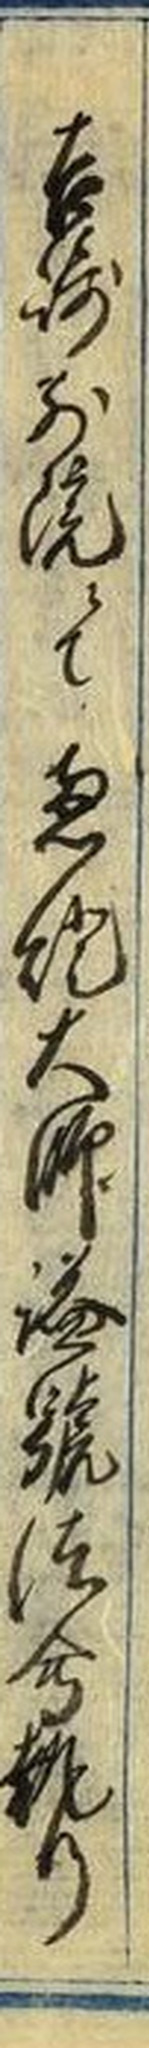吉崎別院にて恵燈大師諡号法会執行
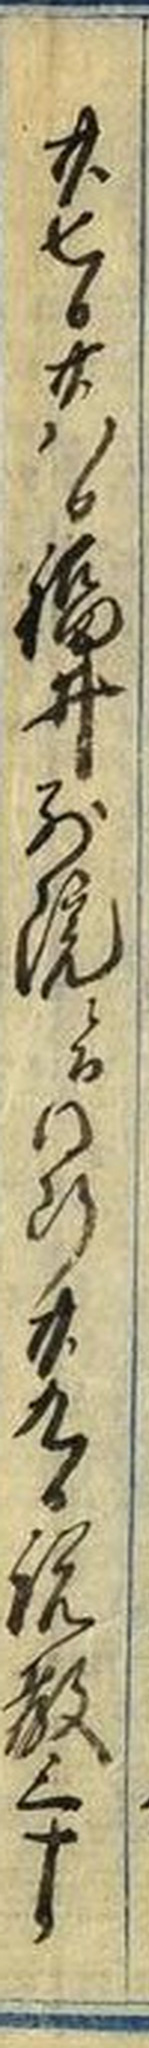廿七日廿八日福井別院に而同断廿九日説教三十日
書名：温古集 五巻
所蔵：福井県文書館 Fukui Prefectural Archives
